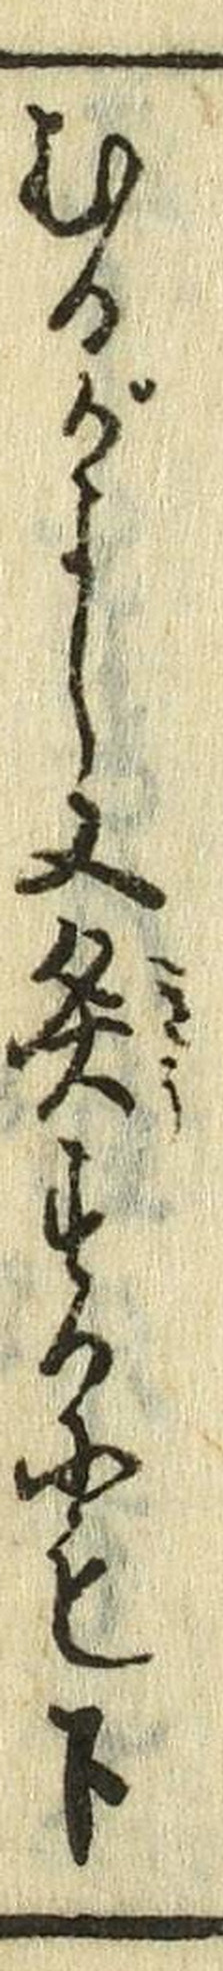むるがよし又灸するにも下
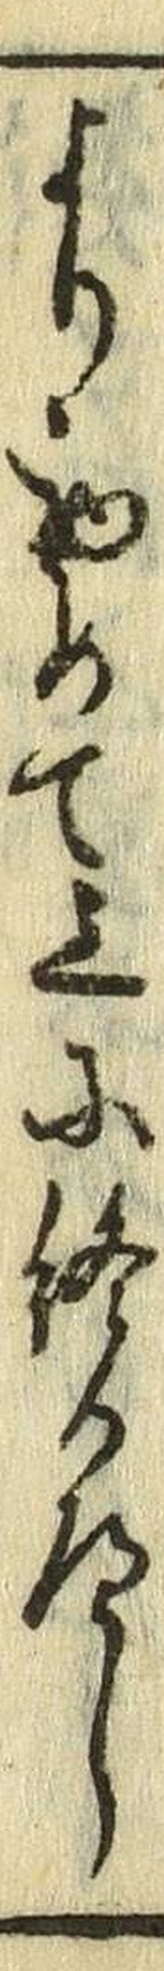より初めて上に終るべし
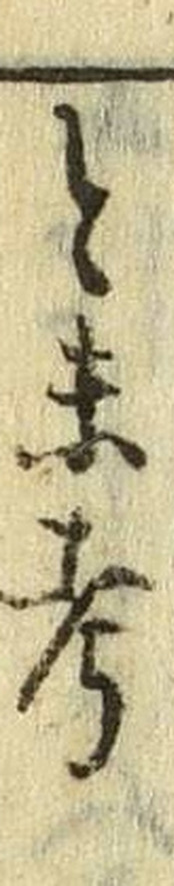と未考
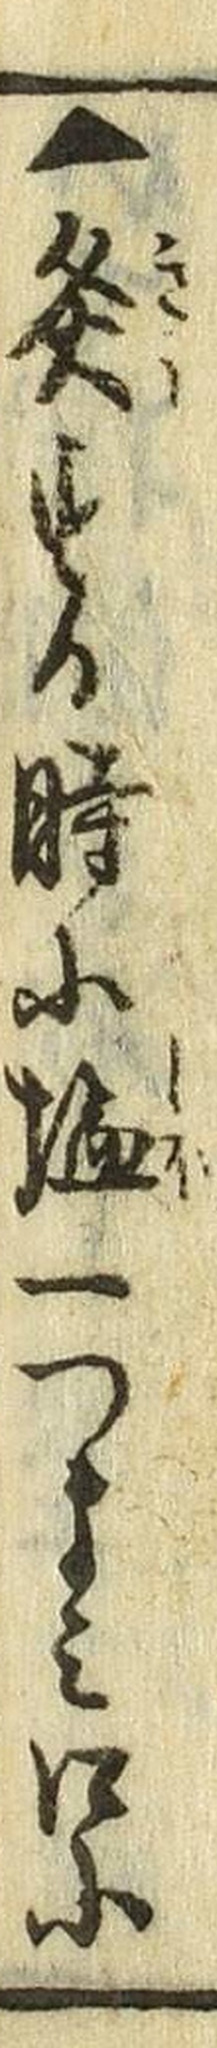▲灸する時に塩一つまみ口に
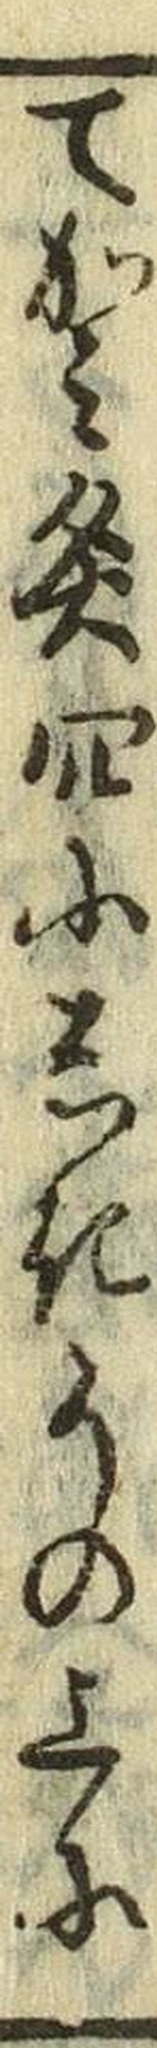てかみ灸穴にしきその上に
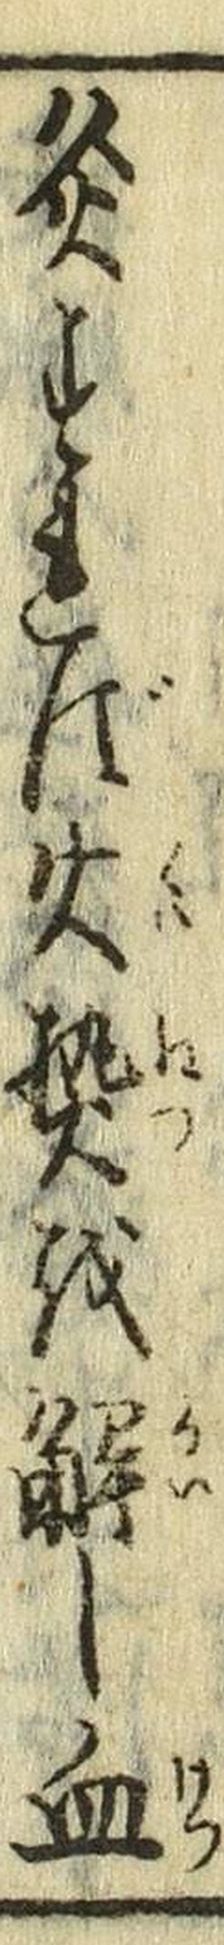灸すれば火熱を解し血
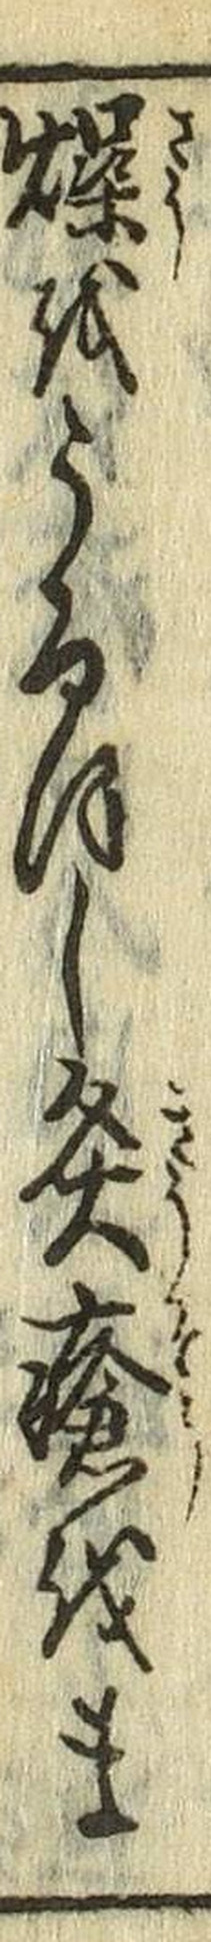燥をうるほし灸瘡をま
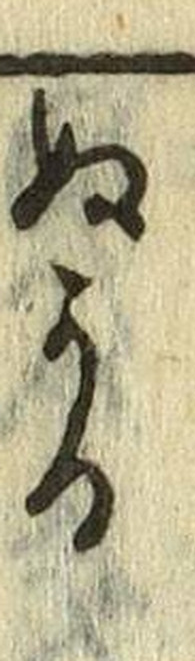ぬかる
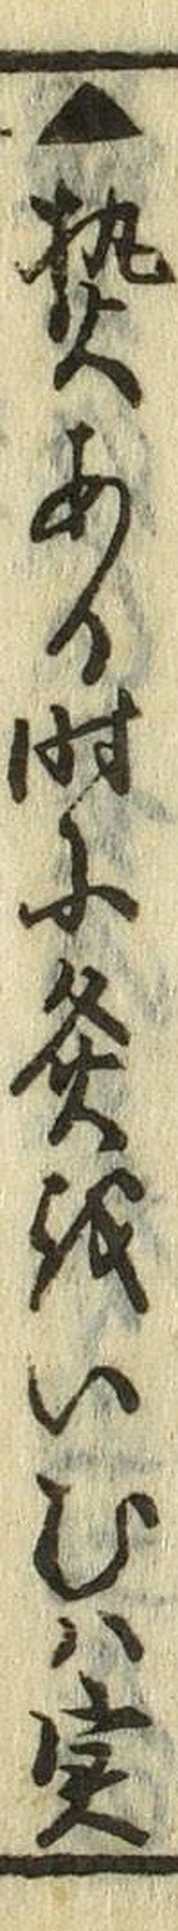▲熱ある時に灸をいむは実
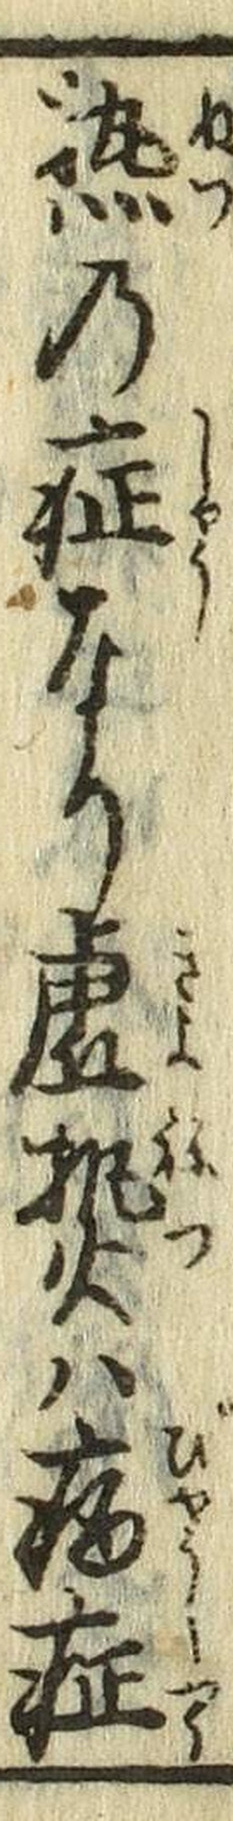熱の症なり虚熱は病症
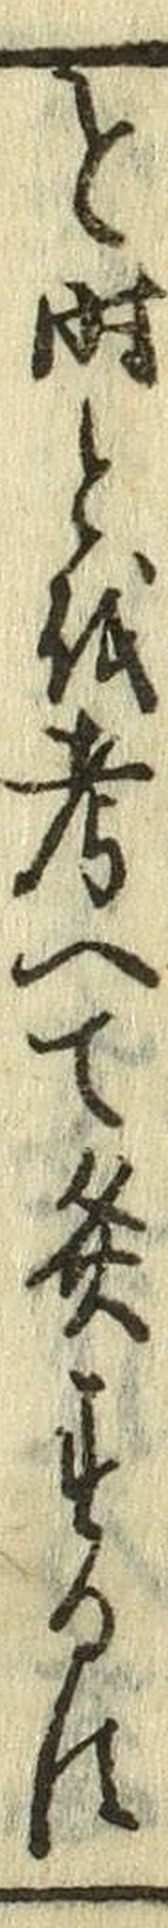と時とを考へて灸するは
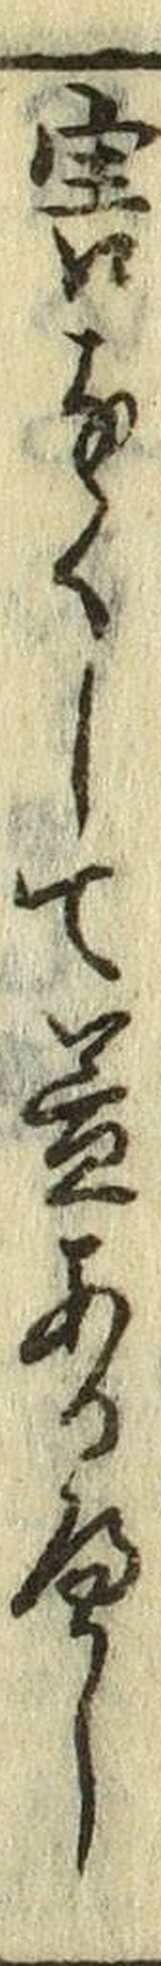害なくして益あるべし
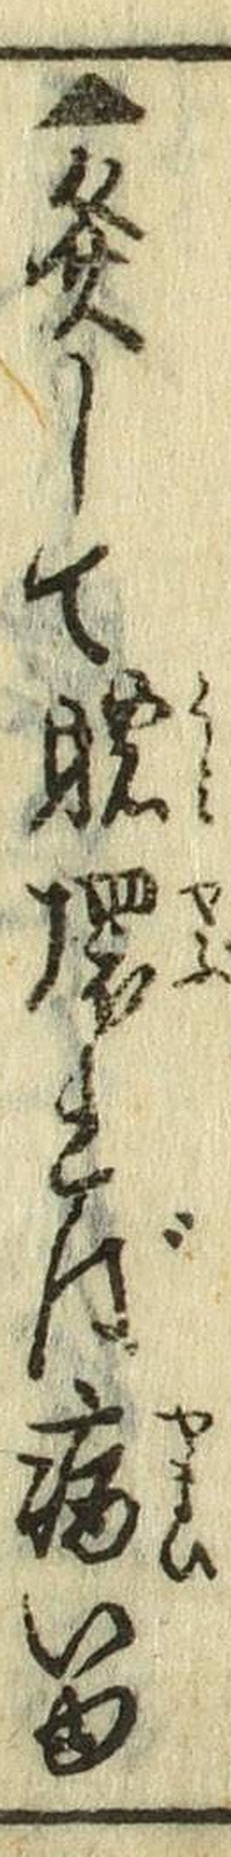▲灸して膿壊れば病いゆ
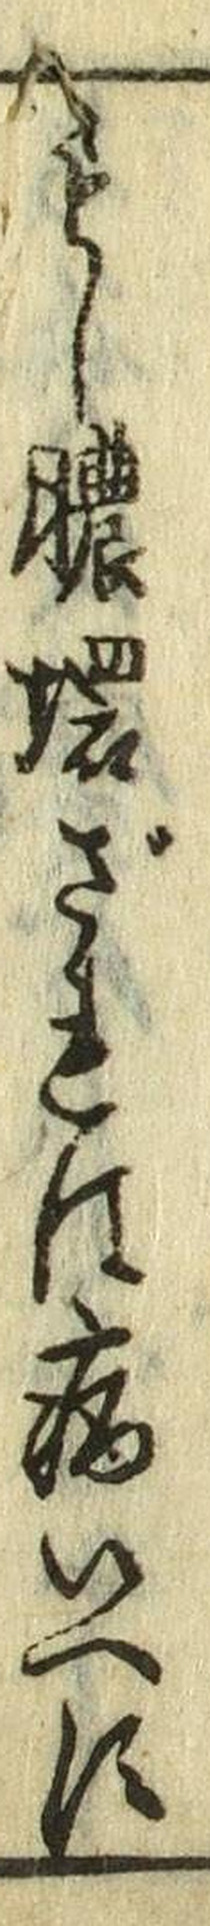もし膿壊ざれは病いへす
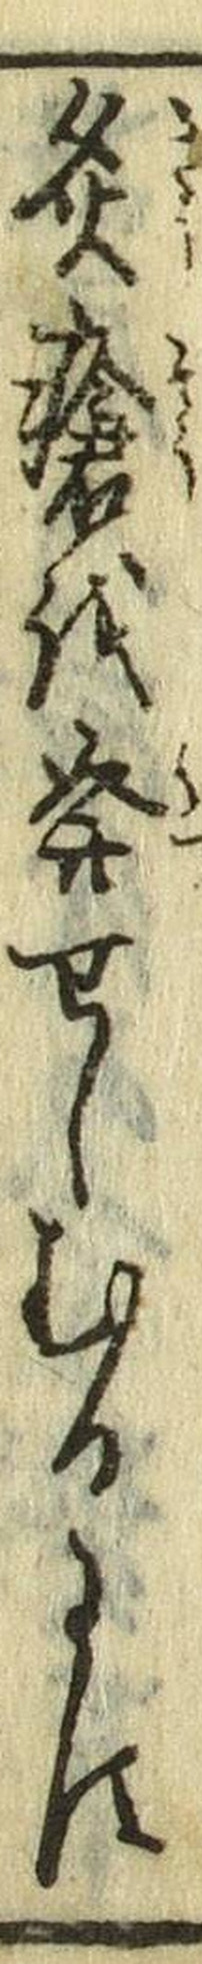灸瘡を発せしむるには

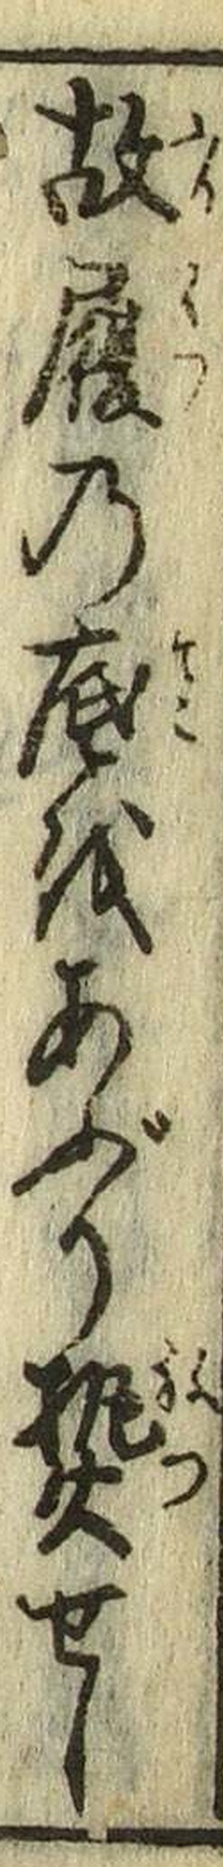故履の底をあぶり熱せし
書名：居家養生記
